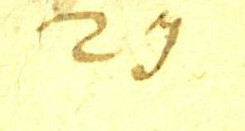21
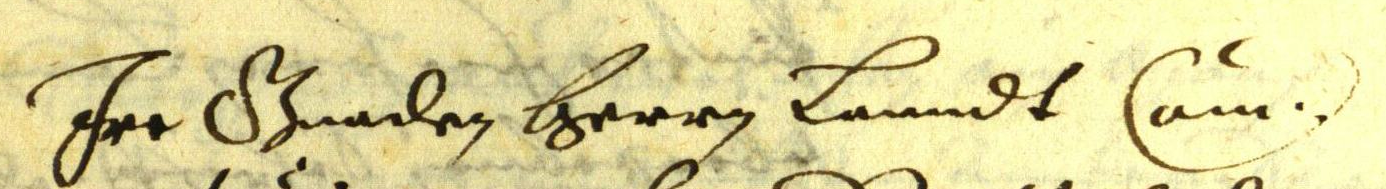Ire Gnaden Herrn Lanndt Com¬
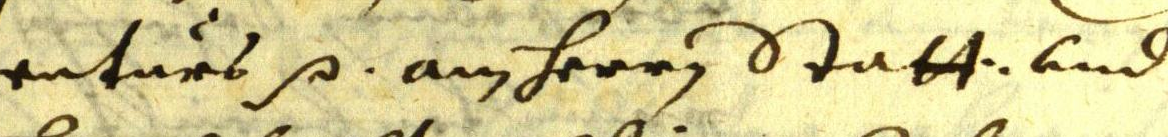entūrs etc. am herrn Statt: vnd
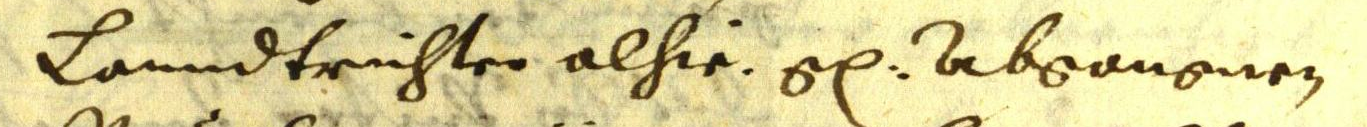Lanndtrichter alhie. g: Abgangen
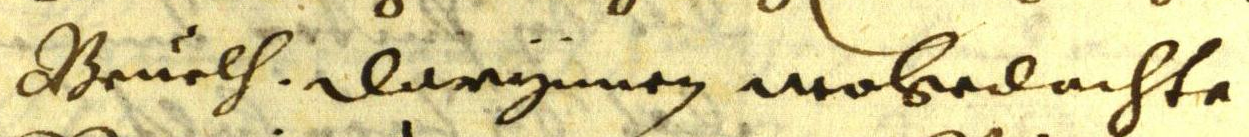Beūelch. darÿnnen wolgedachte
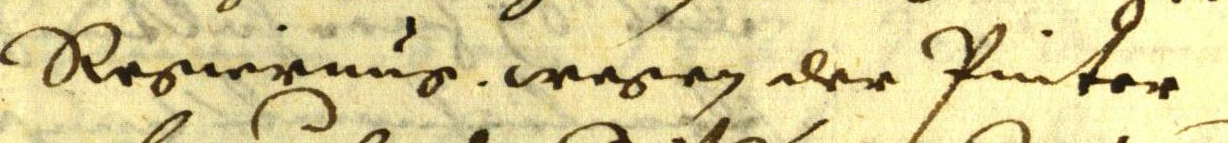Regierūng. wegen der Pinter
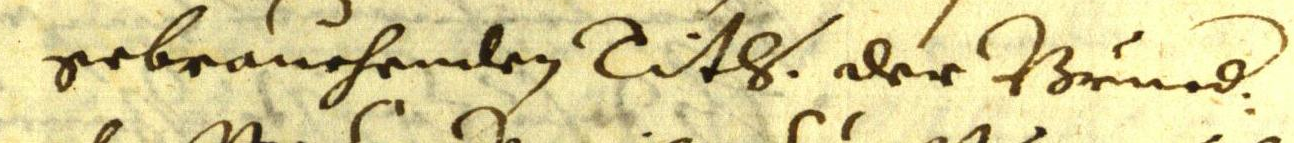gebraūchenden Titls. der Brūed¬
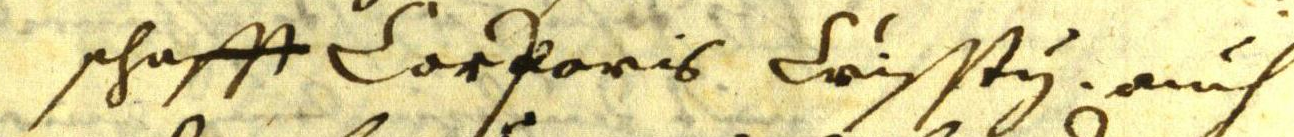schafft Corporis Crisstȳ. aūch
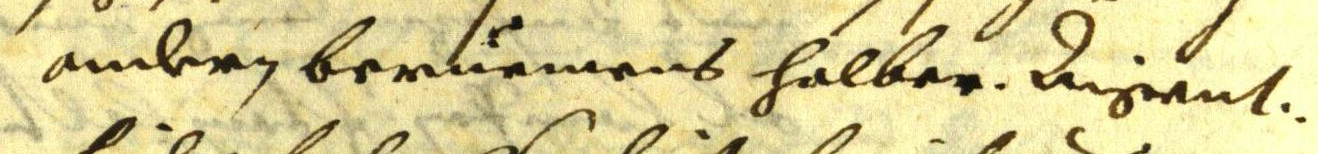andern berūemens halber. Aigent¬
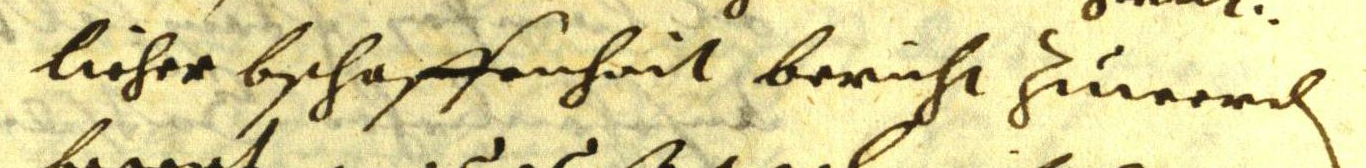licher beschaffenhait bericht Zūwerd
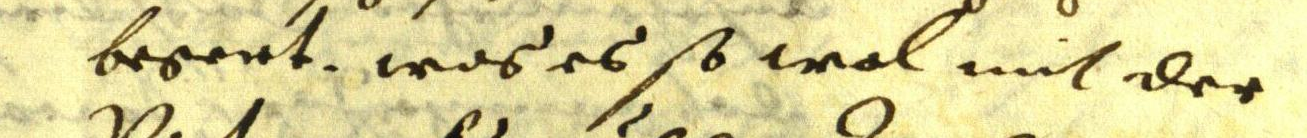begert. was es so wol mit der
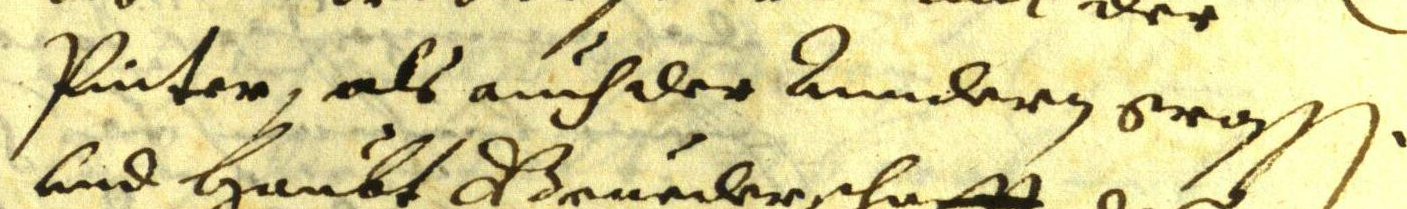Pinter, als aūch der Anndern gross¬
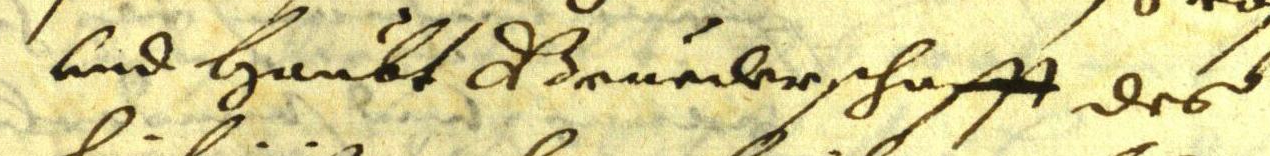vnd Haūbt Brūederschafft des
